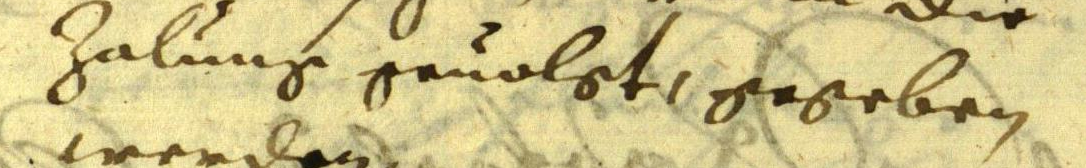Zalūng geūolgt, gegeben
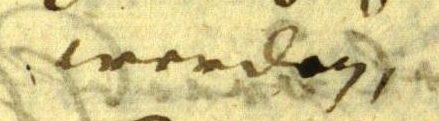werden,
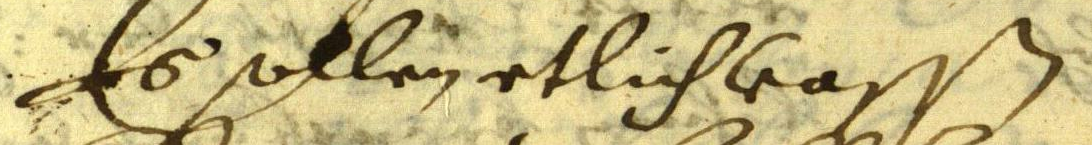Es sollen etlich vasß
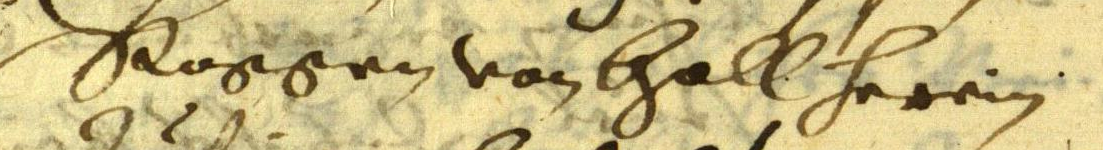Roggen von Hall herein
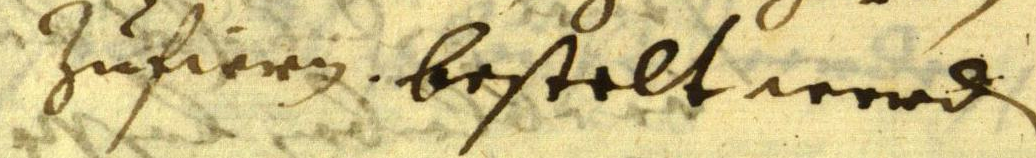Zūfiern. bestelt werd
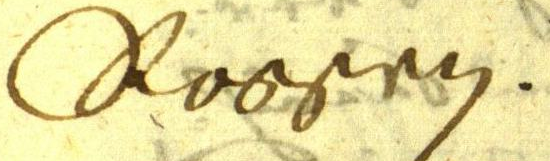Roggen.
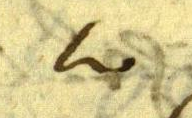t
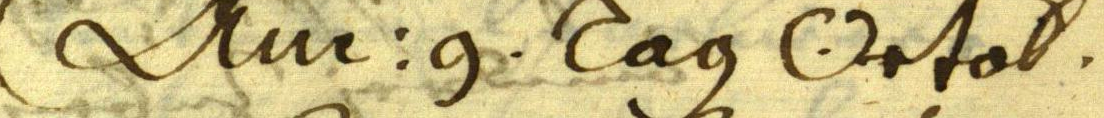Am: 9. Tag Octob.
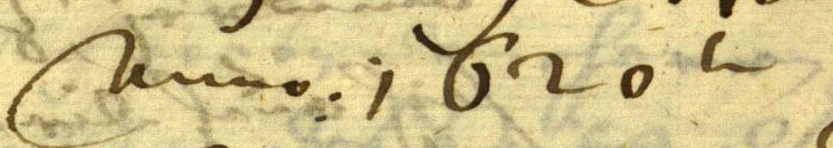Anno: 1620 t
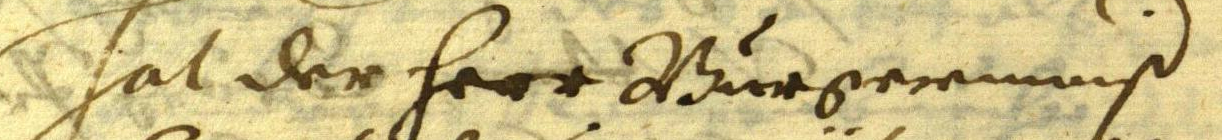Hat der herr Būrgermaist
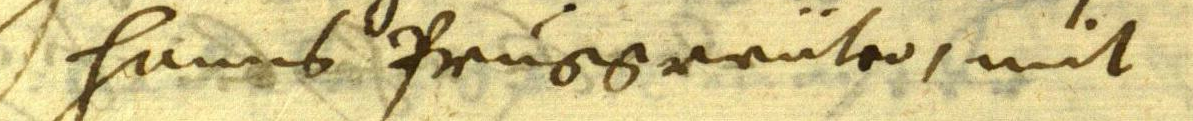Hanns Prūggreüter, mit
